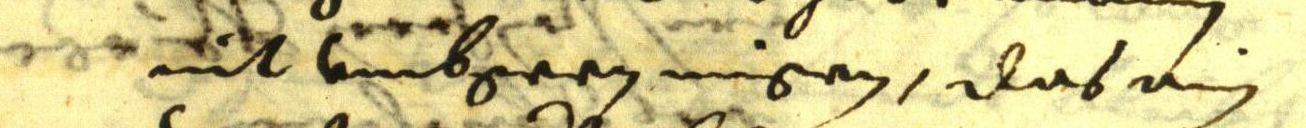nit vmbgeen migen, das ain
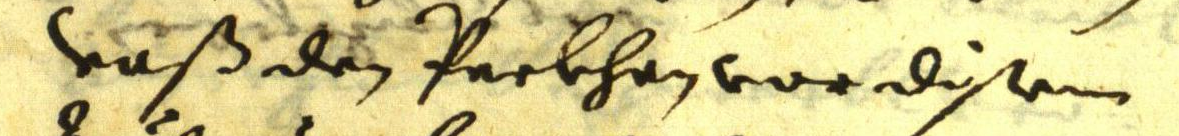vaß den Peckhen vor disem
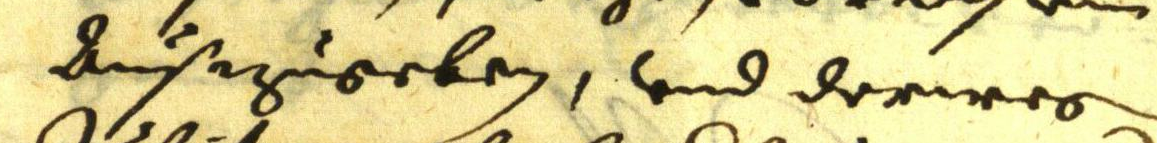Aūszūgeben, vnd derweg
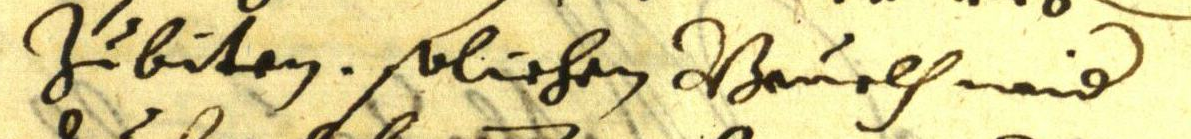Zū biten. solichen Beūelh wid
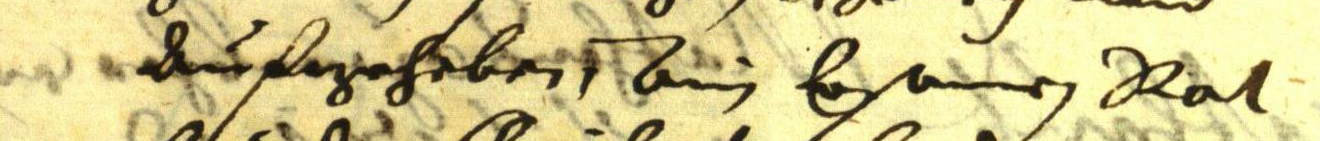Aūfzeheben, Aim Ersamen Rat
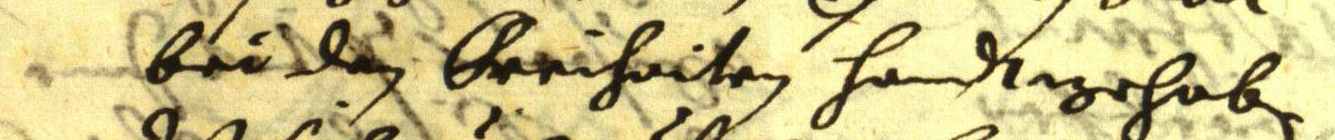bei den Freihaiten handtzehab
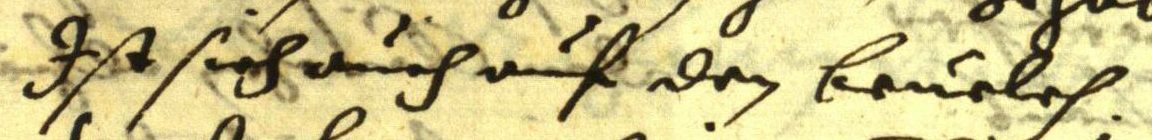Ist sich aūch aūf den beūelch.
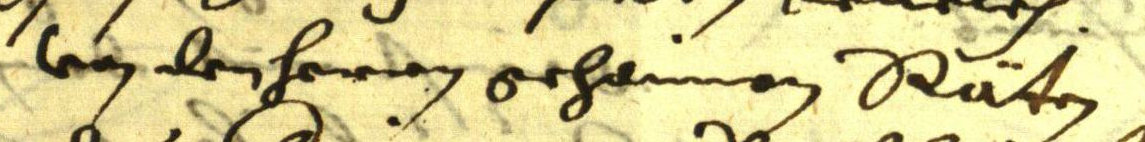von den herrn gehaimen Räten
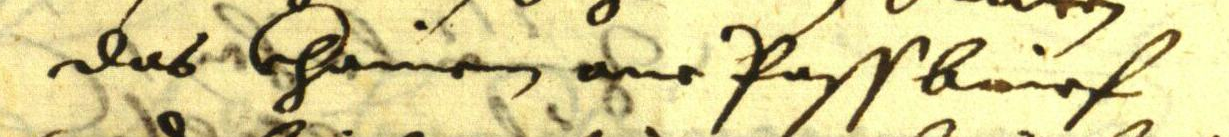das khainem one Passbrief
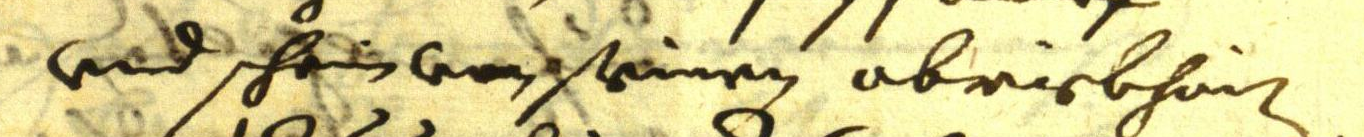vnd schein von seinen obrigkhait.
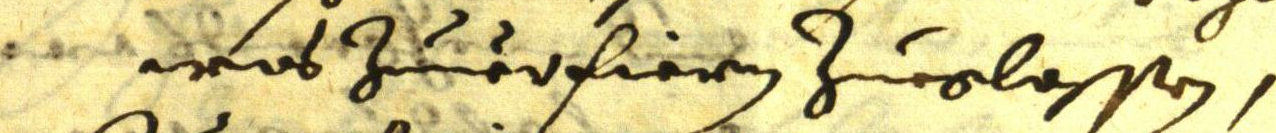was Zūūerfiern Zūeglassen,
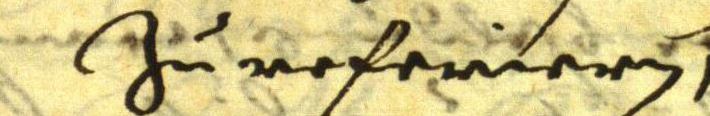Zū referiern,
